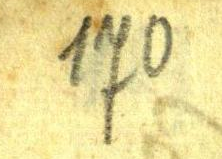170
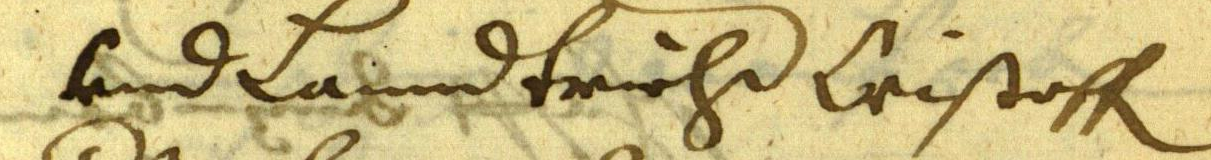vnd Lanndtricht Cristoff
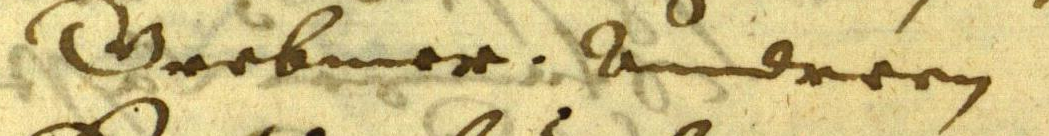Grebmer. Anndreen
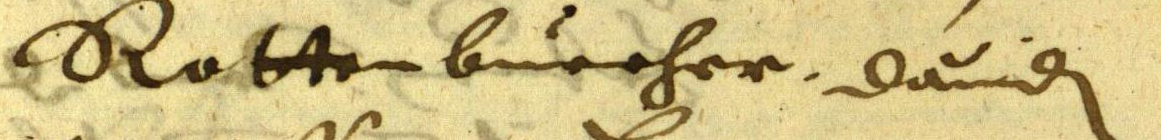Rottenbūecher. Daūid
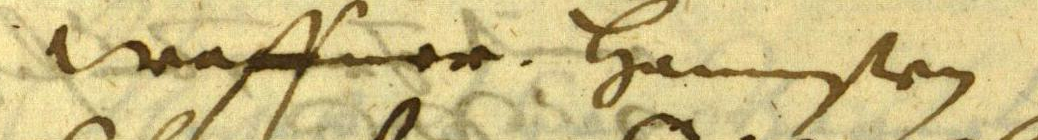Waffner. Hannsen
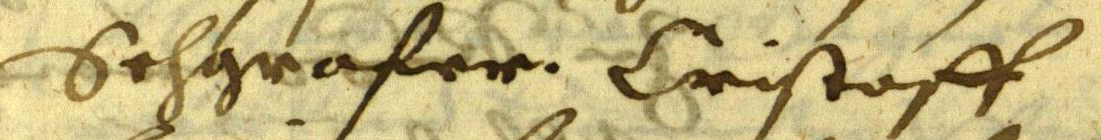Schgrafer. Cristoff
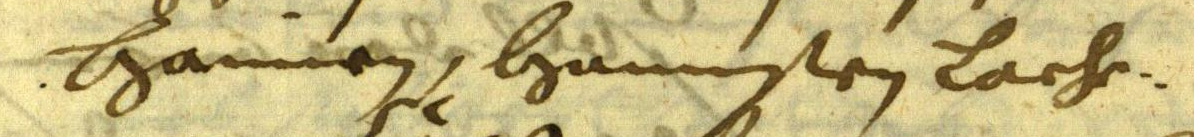Haimen, Hannsen Loche¬
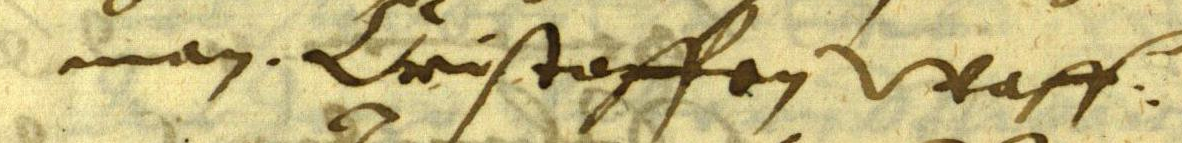man. Cristoffen Waff¬
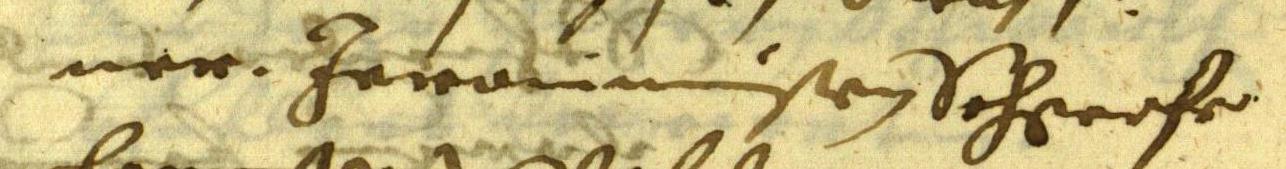ner. Jeronimūsen Schgrafer.
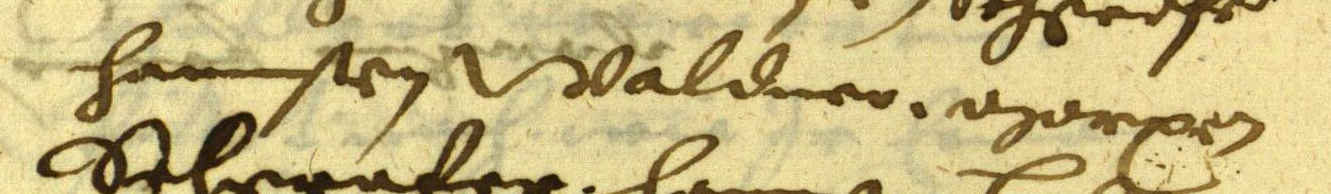hannsen Waldner. Marxen
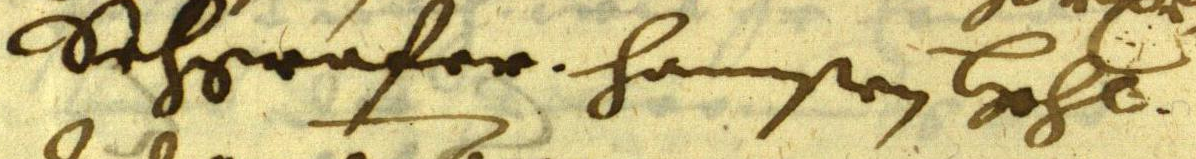Schgrafer. hannsen Hehl.
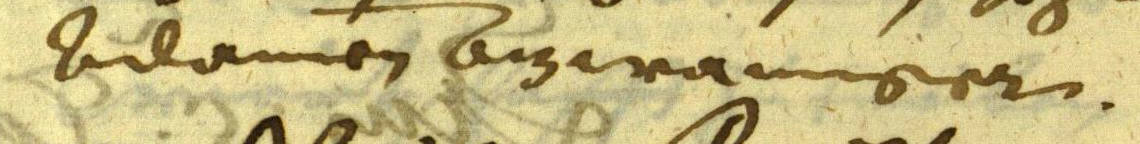Adamen Azwannger.
